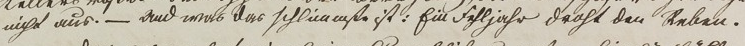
nicht aus. – Und was das schlimmste ist: Ein Fehljahr droht den Reben.
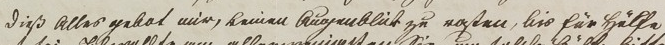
Dieß Alles gebot mir, keinen Augenblick zu rasten, bis für Hülfe
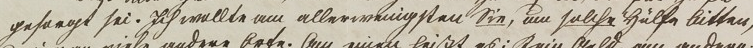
gesorgt sei. Ich wollte am allerwenigsten Sie, um solche Hülfe bitten,
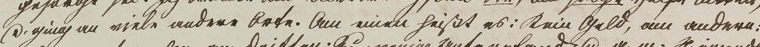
&. ging an viele andere Orte. Am einen heißt es: Kein Geld, am andern:
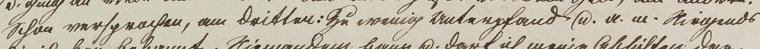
Schon versprochen, am Dritten: zu wenig Unterpfand u. a. m. Nirgends
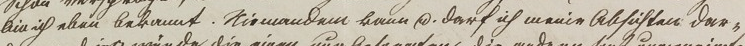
bin ich eben bekannt. Niemanden kann &. darf ich meine Absichten dar-
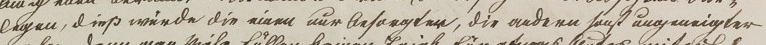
legen, dieß würde die einen nur besorgter, die andern sonst ungeneigter
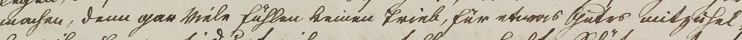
machen, denn gar Viele fühlen keinen Trieb, für etwas Gutes mitzuhel-
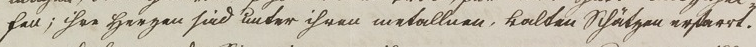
fen; ihre Herzen sind unter ihren metallnen, kalten Schätzen erstarrt.
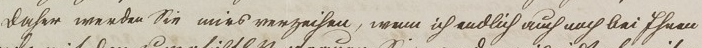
Daher werden Sie mirs verzeihen, wenn ich endlich auch noch bei Ihnen
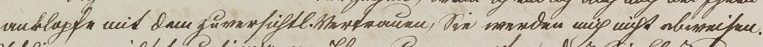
anklopfe mit dem zuversichtl. Vertrauen, Sie werden mich nicht abweisen.
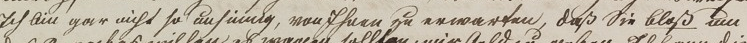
Ich bin gar nicht so unsinnig, von Ihnen zu erwarten, daß Sie bloß um
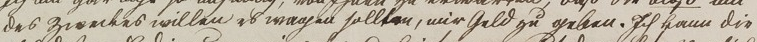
des Zweckes willen es wagen sollten, mir Geld zu geben. Ich kann die
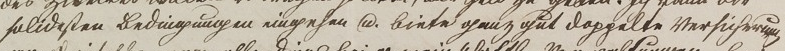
solidesten Bedingungen eingehen &. biete ganz gut doppelte Versicherung
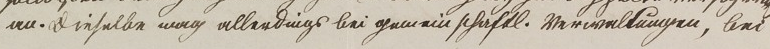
an. Dieselbe mag allerdings bei gemeinschaftl. Verwaltungen, bei
